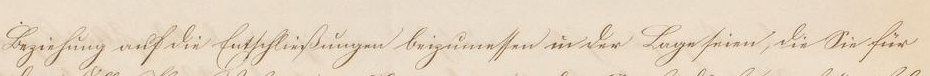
Beziehung auf die Entschließungen beizumessen in der Lage seien, die Sie für
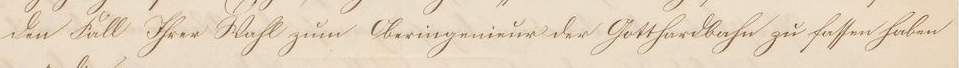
den Fall Ihrer Wahl zum Oberingenieur der Gotthardbahn zu fassen haben
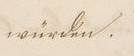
würden.
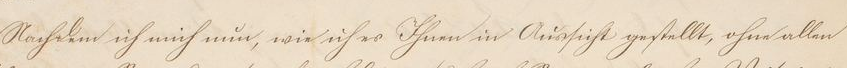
Nachdem ich mich nun, wie ich es Ihnen in Aussicht gestellt, ohne allen
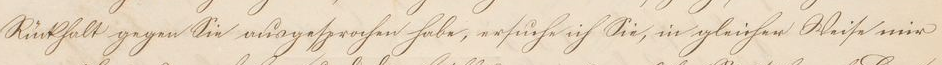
Rückhalt gegen Sie ausgesprochen habe, ersuche ich Sie, in gleicher Weise mir
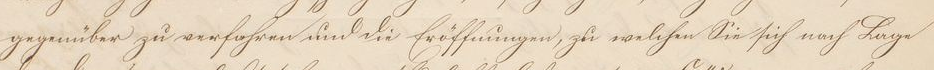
gegenüber zu verfahren und die Eröffnungen, zu welchen Sie sich nach Lage
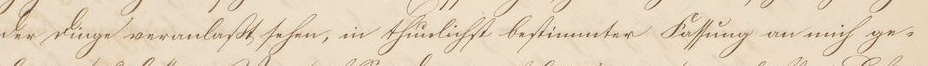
der Dinge veranlaßt sehen, in thunlichst bestimmter Fassung an mich ge-
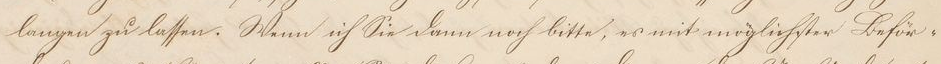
langen zu lassen. Wenn ich Sie dann noch bitte, es mit möglichster Beför-
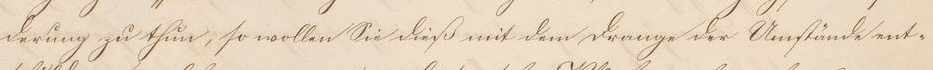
derung zu thun, so wollen Sie dieß mit dem Drange der Umstände ent-
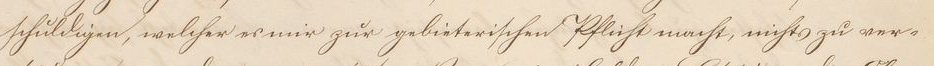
schuldigen, welcher es mir zur gebieterischen Pflicht macht, nichts zu ver-
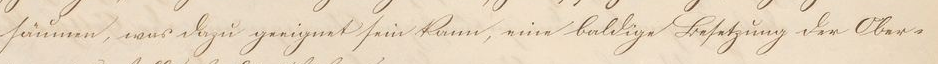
säumen, was dazu geeignet sein kann, eine baldige Besetzung der Ober-
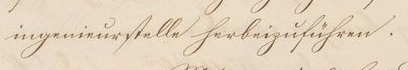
ingenieurstelle herbeizuführen.
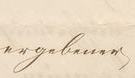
ergebener
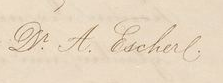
Dr A. Escher.
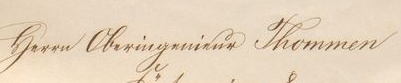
Herrn Oberingenieur Thommen
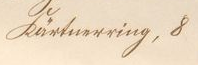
Kärtnerring, 8
